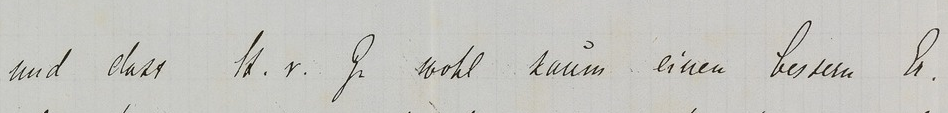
und dass H. v. G. wohl kaum einen bessern Er-
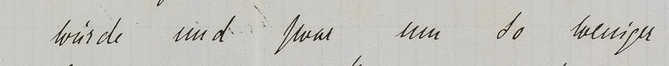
würde und zwar um so weniger
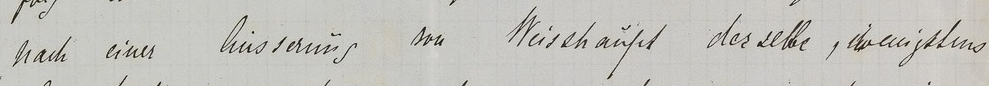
nach einer Äusserung von Weisshaupt derselbe, wenigstens
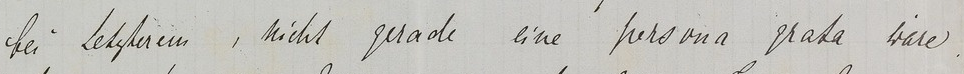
bei letzterem, nicht gerade ein persona grata wäre.
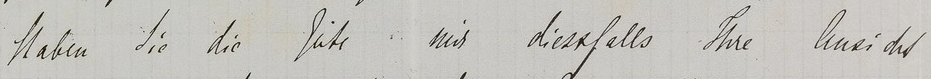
Haben Sie die Güte mir diessfalls Ihre Ansicht
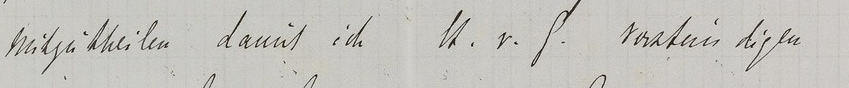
mitzutheilen damit ich H. v. G. verständigen
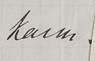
kann.
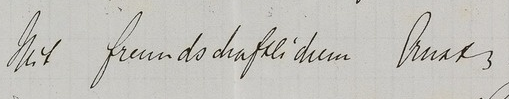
Mit freundschaftlichem Grusse
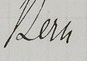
Welti
